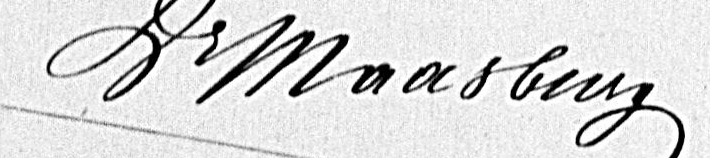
Dr Maasburg
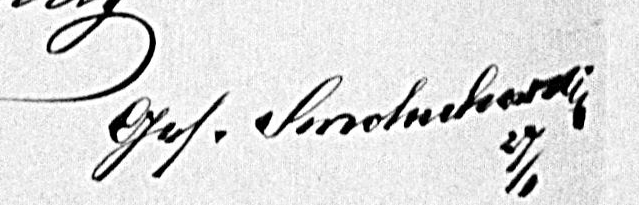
Ges.xx
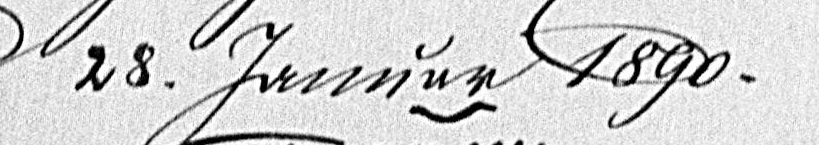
Am 28. Januar 1890.
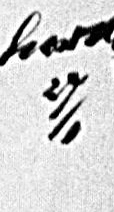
Ges.xx
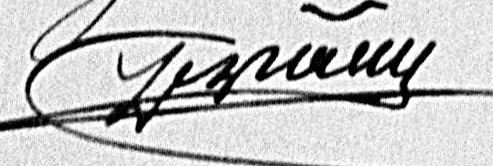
xx
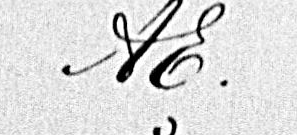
AE.
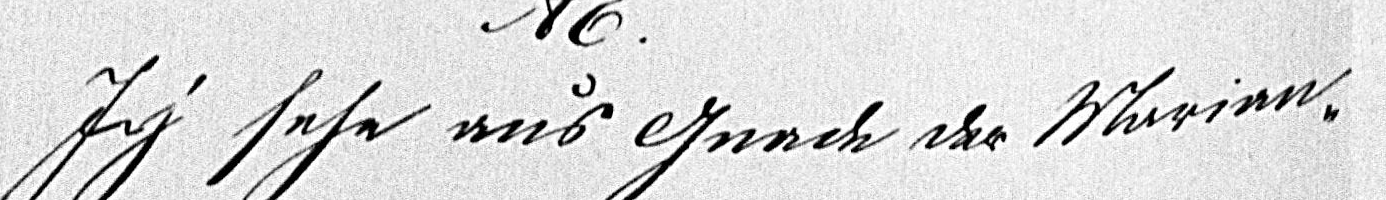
Ich sehe aus Gnade der Marian
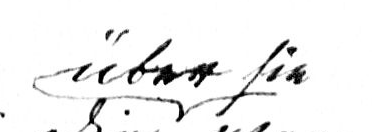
über sie
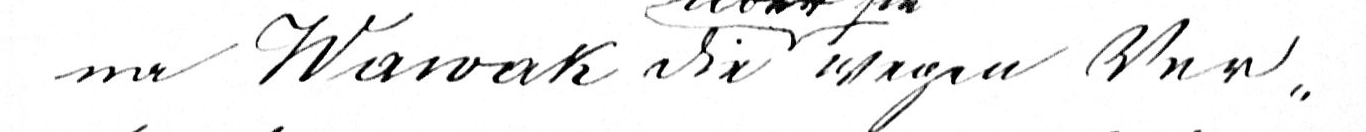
na Wawak die wegen Ver¬
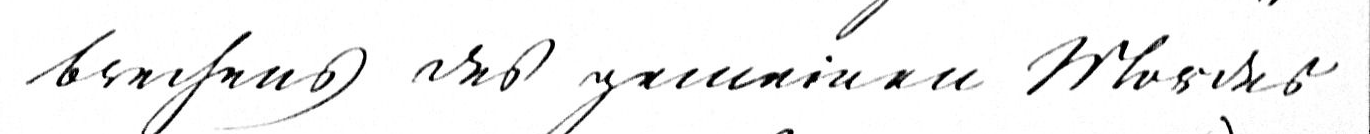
brechens des gemeinen Mordes
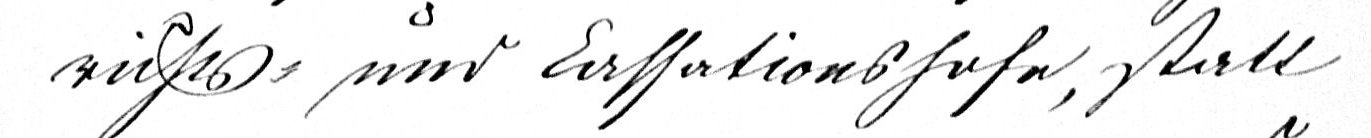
richts- und Cassationshofe, statt
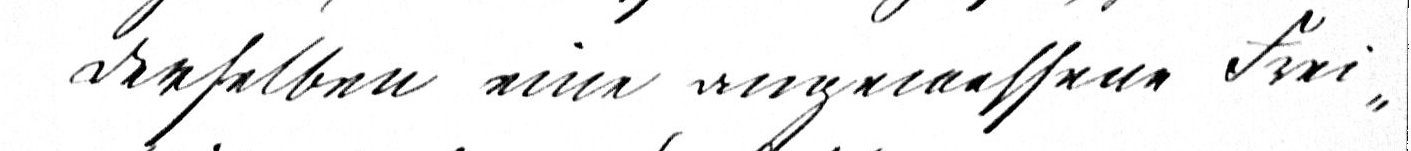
derselben eine angemessene Frei¬
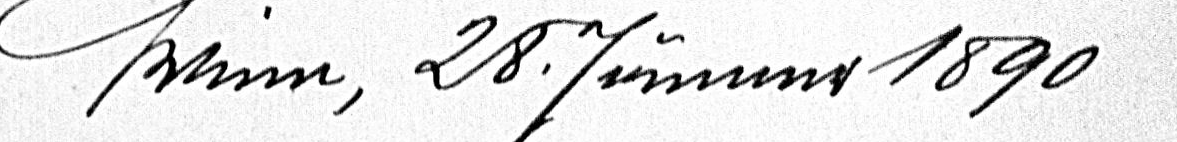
Wien, 28. Jänner 1890
